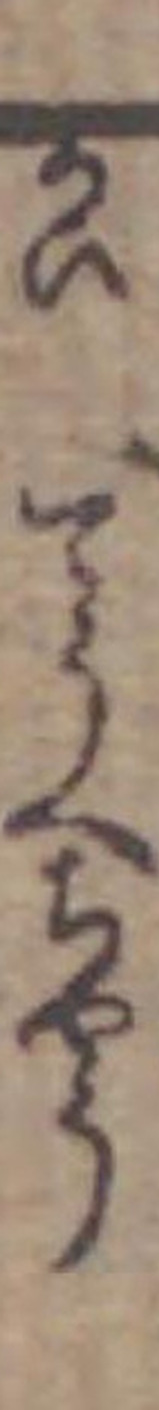かいてうへちやう
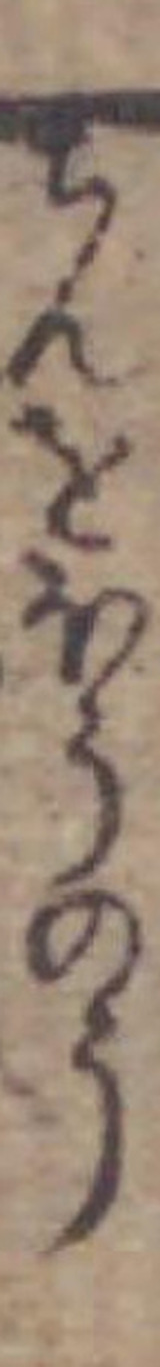ちんをほうのう
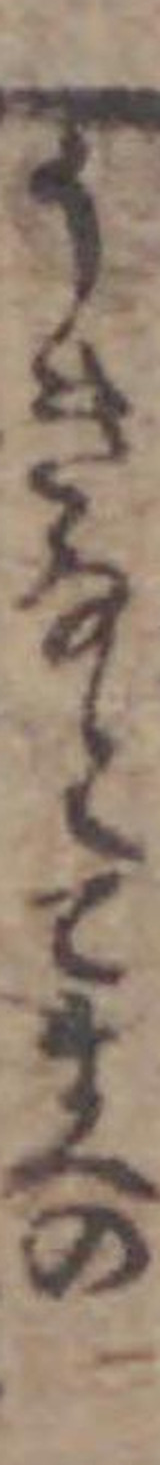うきなとてまへの
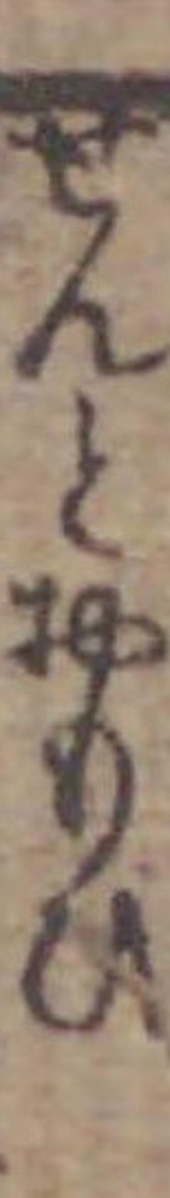せんとおもひ
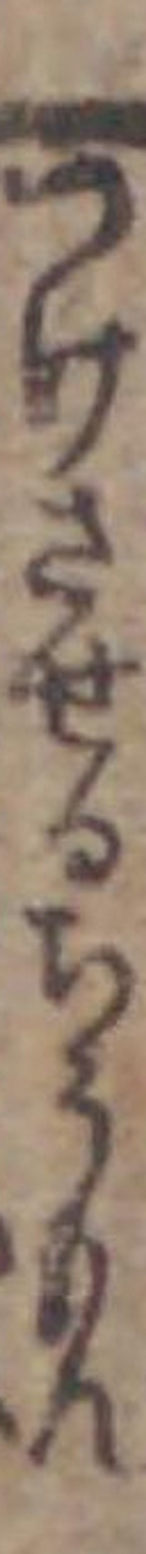つけさせるちうもん
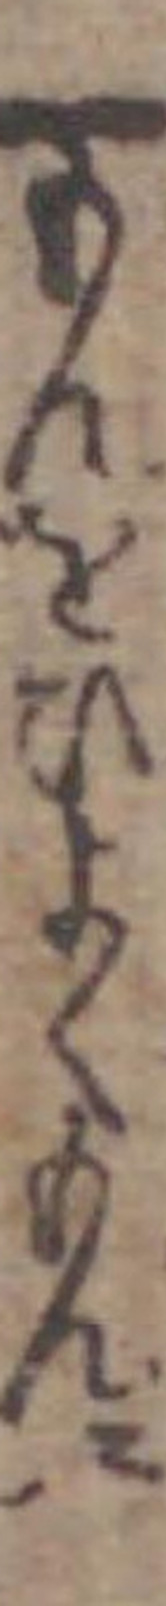もんをひよくもんに
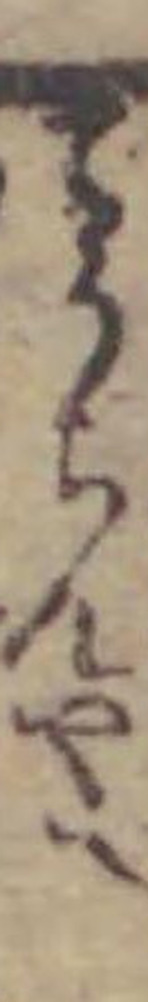てうちんやへ
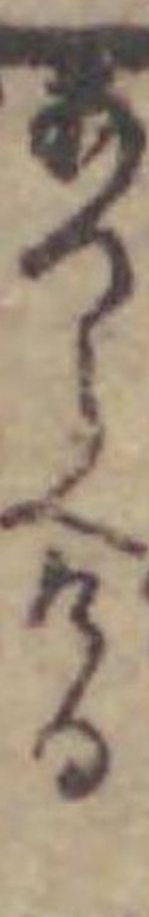あつらへける
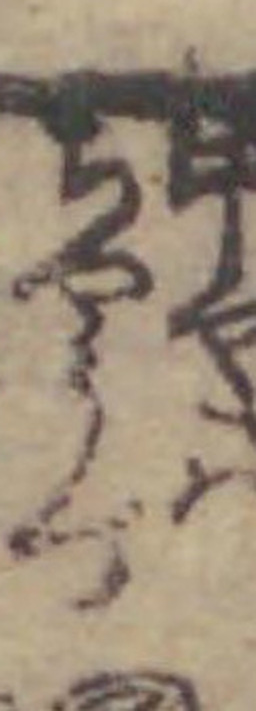ちやうづ
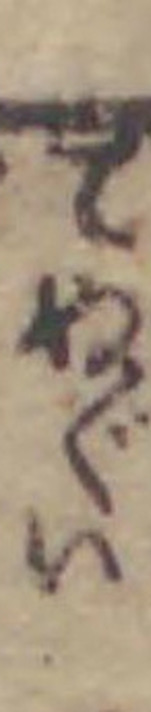てぬぐい
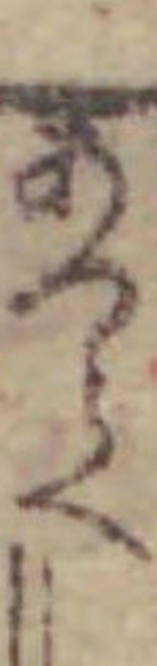あつらへ
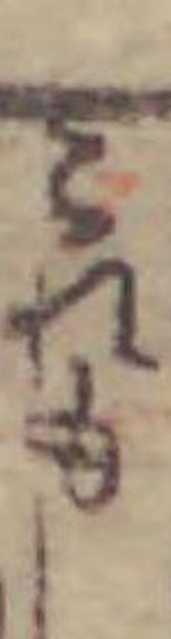これも
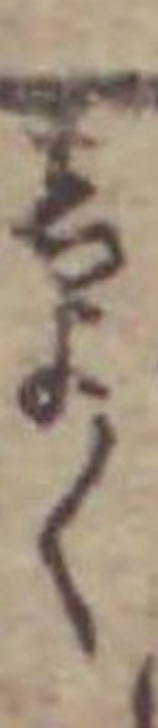しよ〳〵
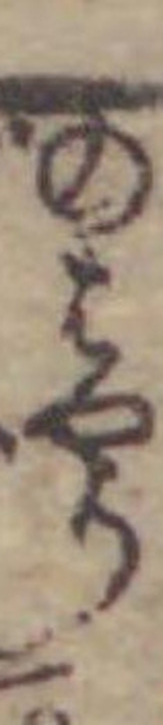のはやり
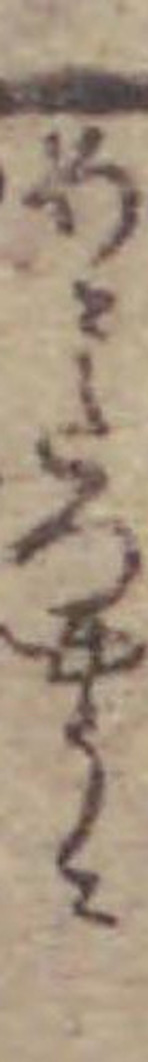めにたつやうに
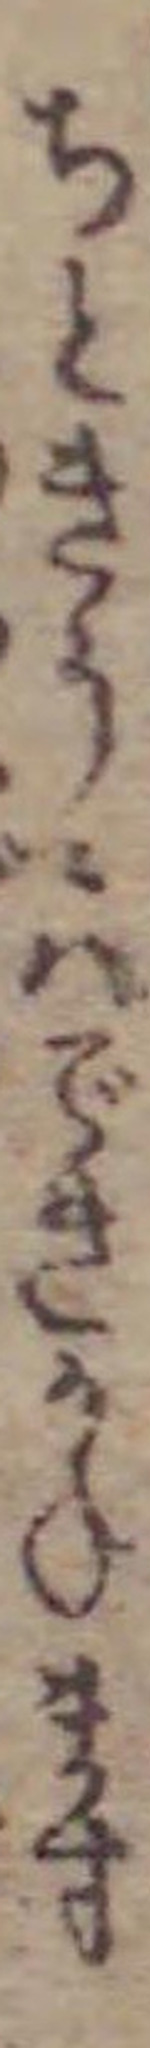ちときうにはできかねます
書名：江戸生艶気樺焼 : 3巻
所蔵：国立国会図書館 National Diet Library, JAPAN
